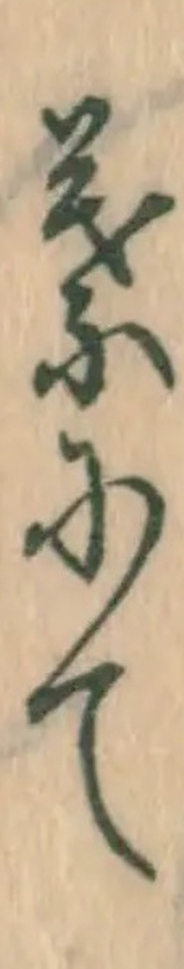葉にて
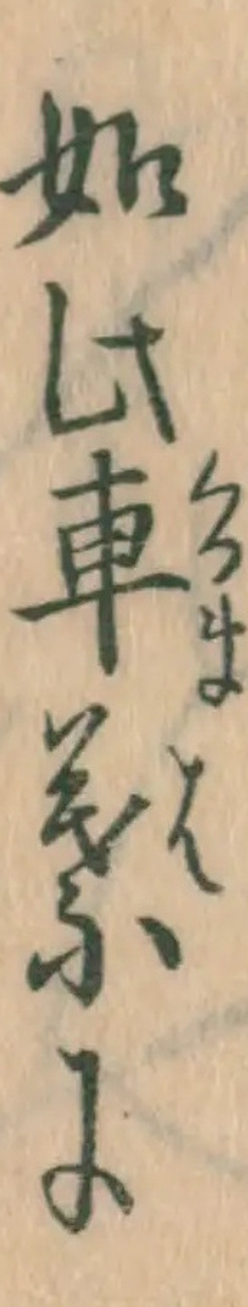如此車葉に
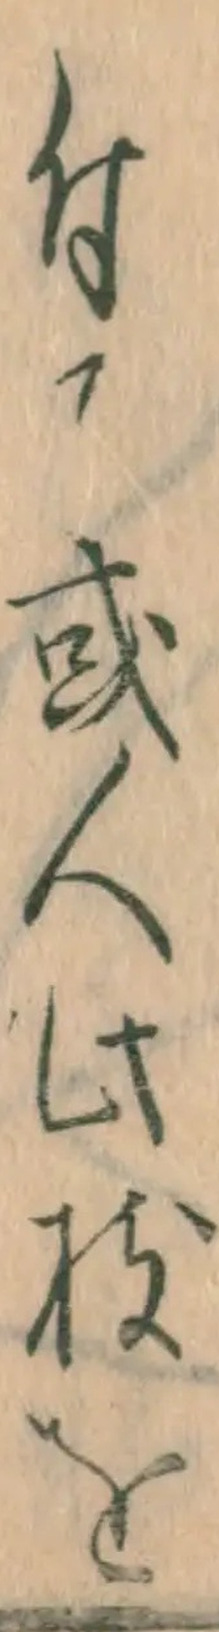付て或人此枝を
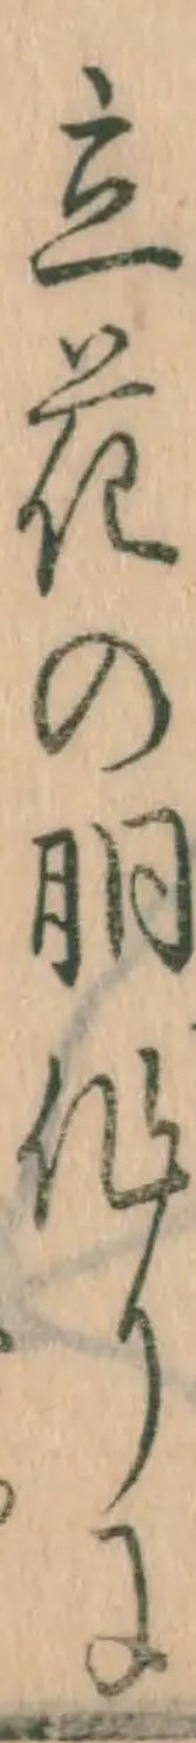立花の胴作りに
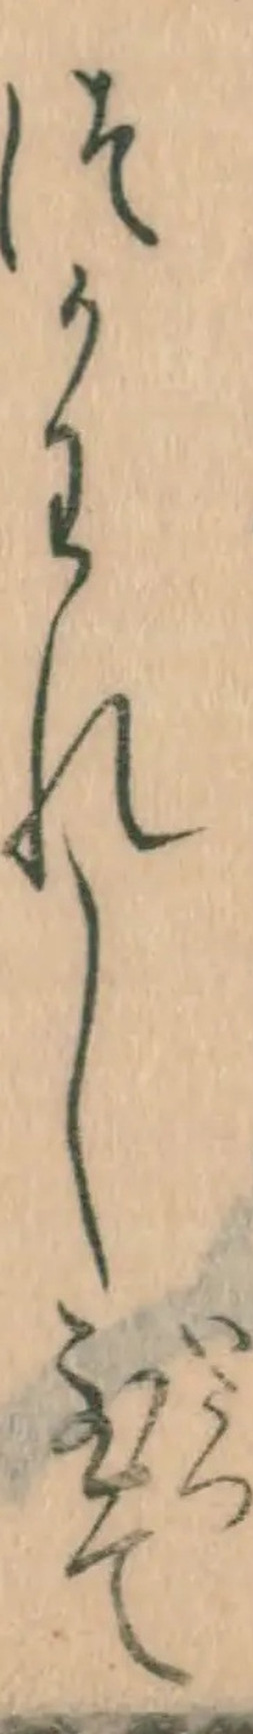つかわれし至て
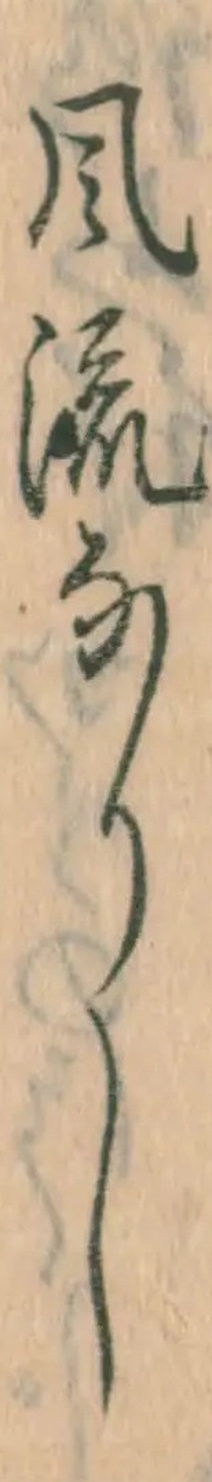風流なりし
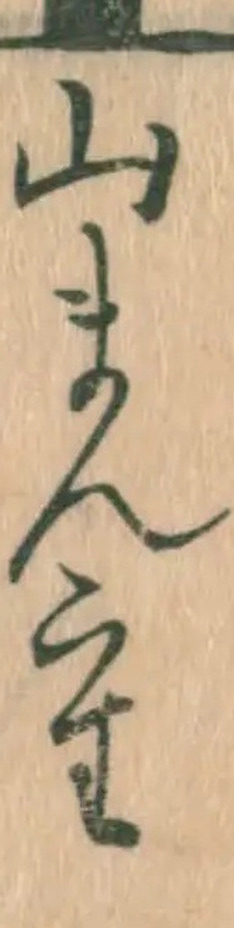山まん重
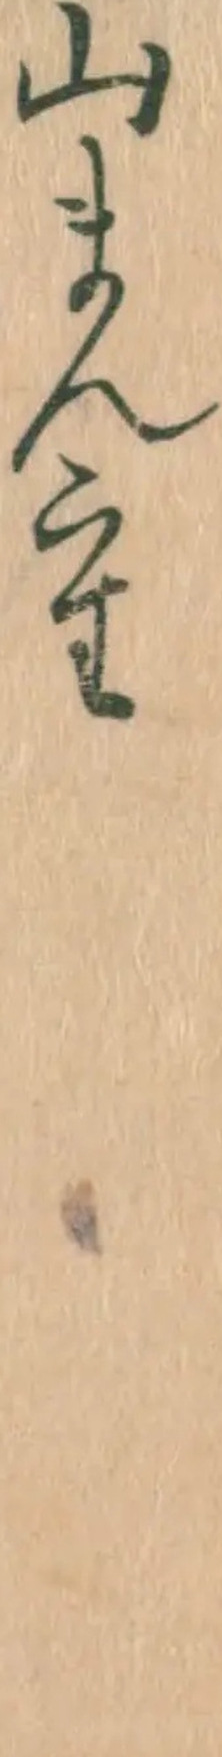山まん重
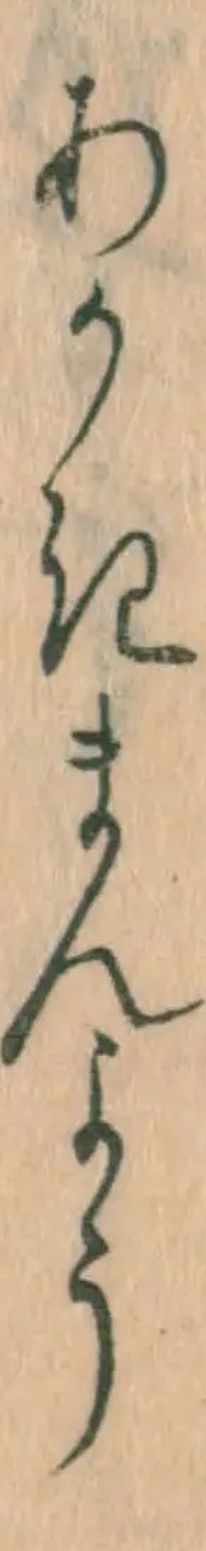あかきまんよう
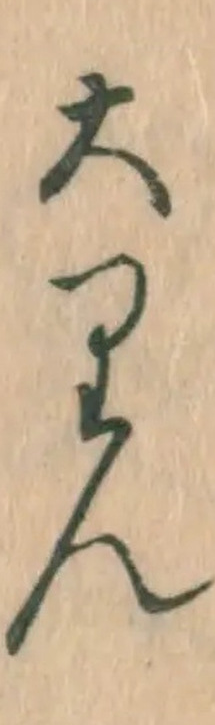大りん
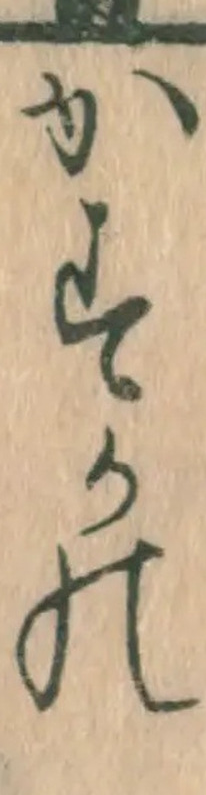かすかの
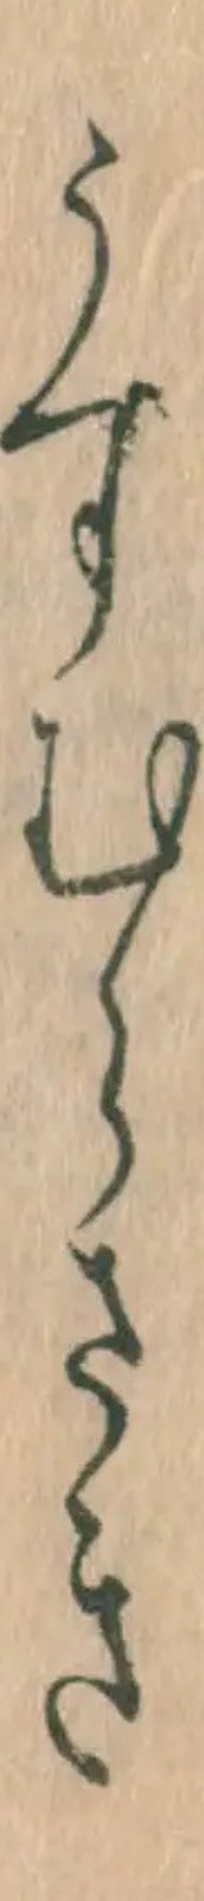うすむらさき
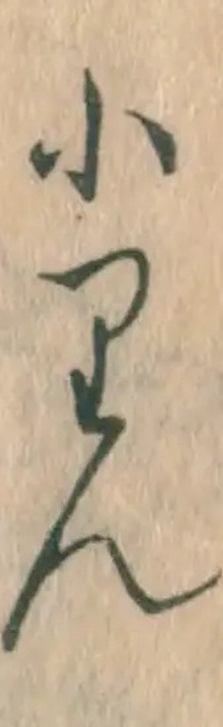小りん
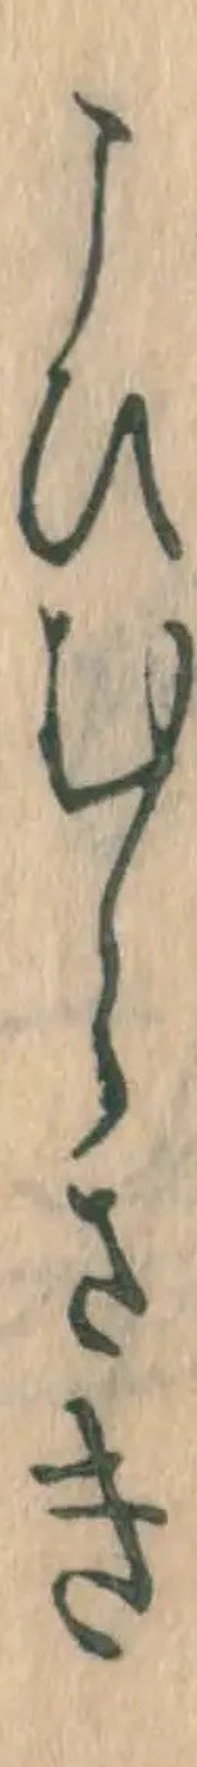こひむらさき
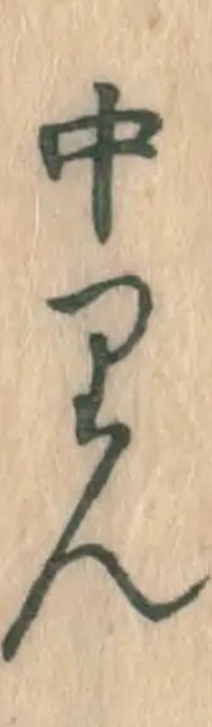中りん

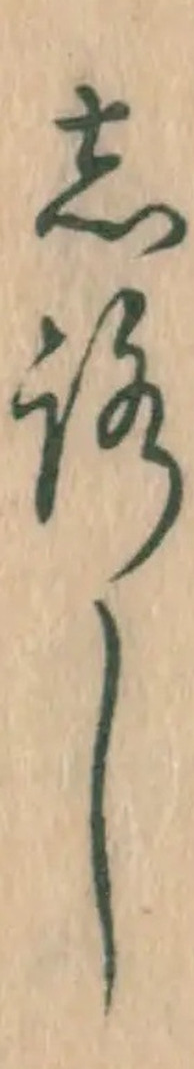しろし
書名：錦繍枕 5巻. [3]
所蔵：国立国会図書館 National Diet Library, JAPAN
